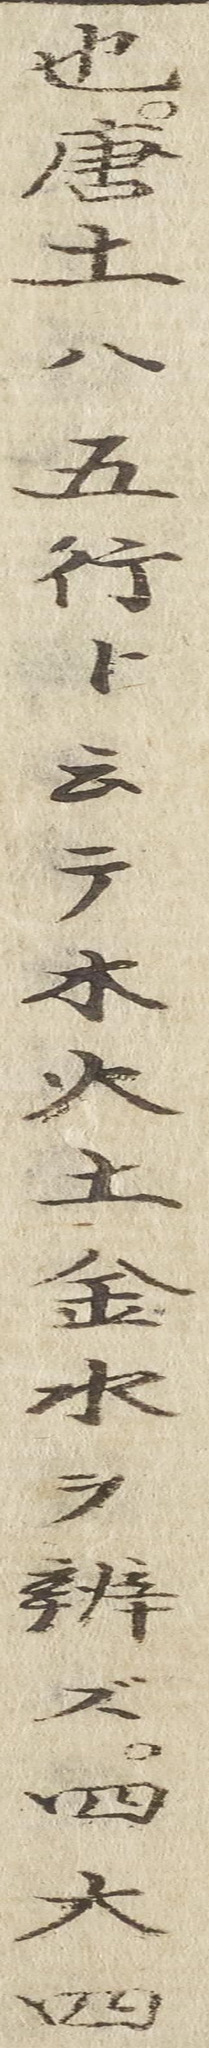也。唐土ハ五行ト云テ木火土金水ヲ弁ズ。四大四
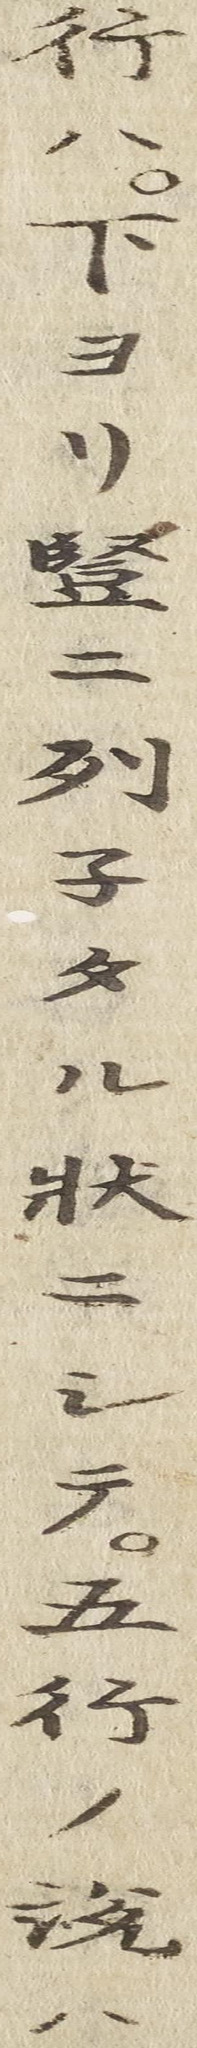行ハ。下ヨリ竪ニ列子タル状ニシテ。五行ノ説ハ
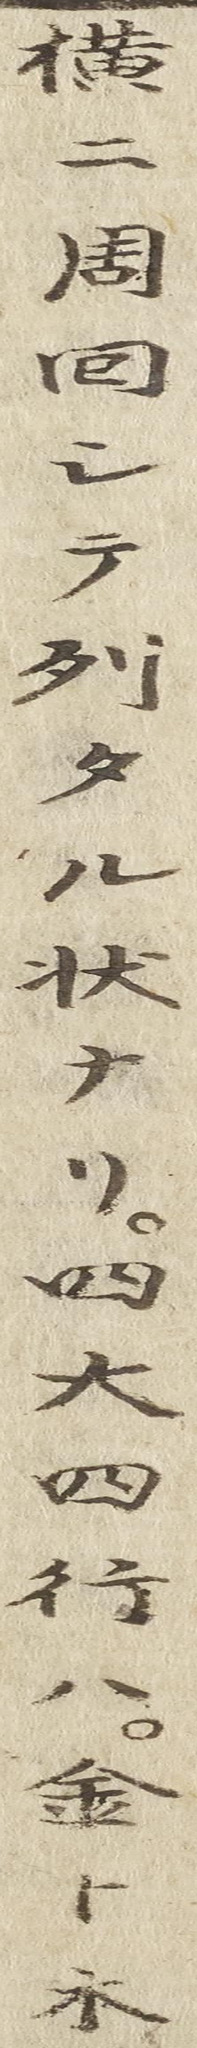横ニ周回シテ列タル状ナリ。四大四行ハ。金ト木
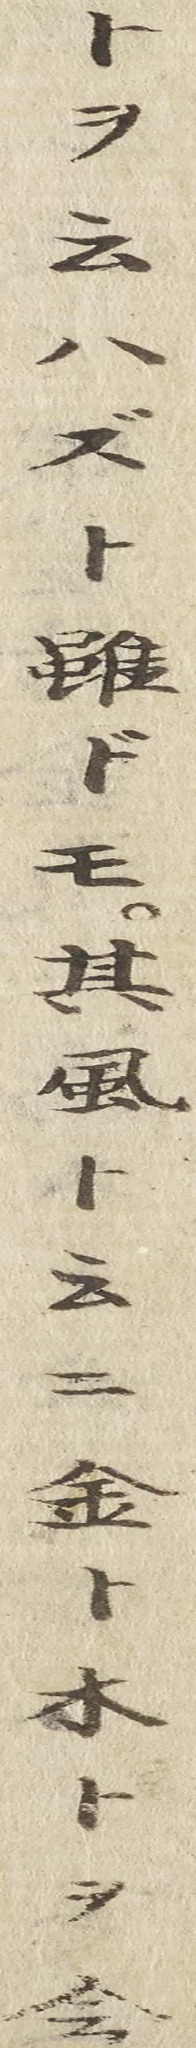トヲ云ハズト雖ドモ。其風ト云ニ金ト木トヲ会
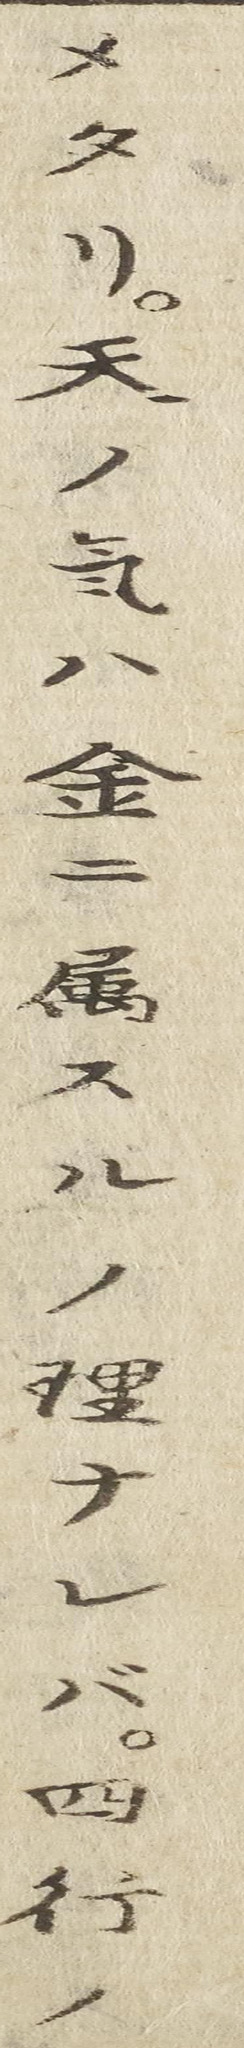メタリ。天ノ気ハ金ニ属スルノ理ナレバ。四行ノ
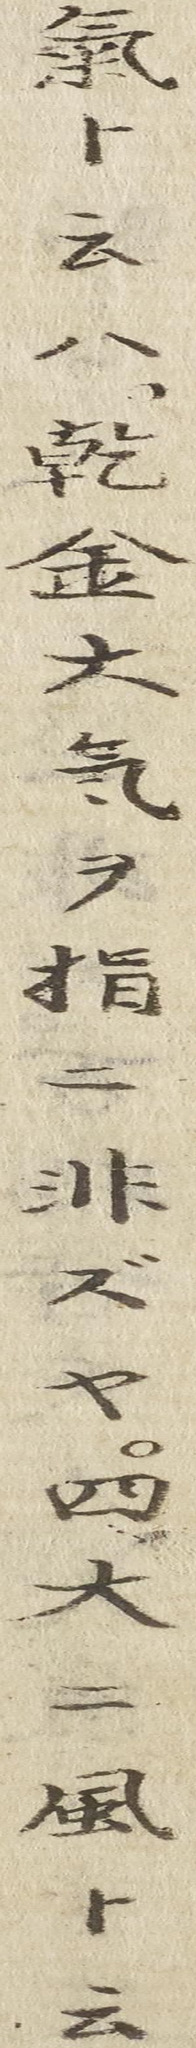気ト云ハ。乾金大気ヲ指ニ非ズヤ。四大ニ風ト云
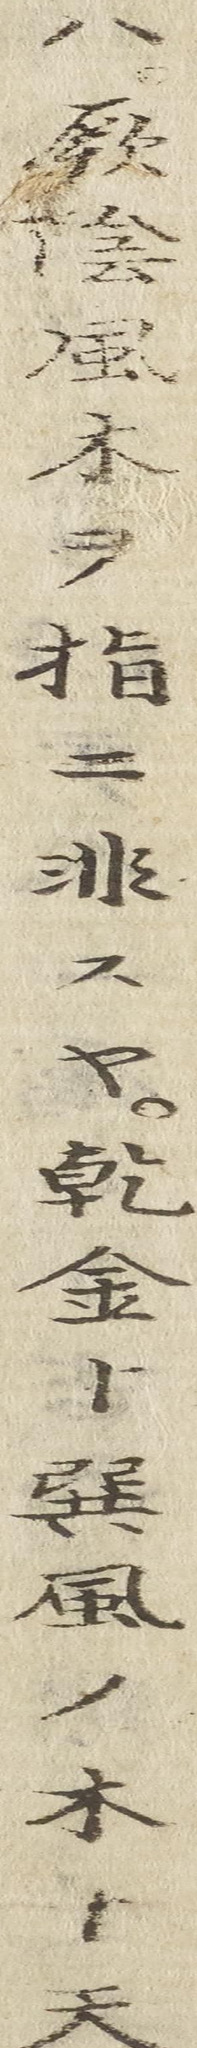ハ。厥陰風木ヲ指ニ非スヤ。乾金ト巽風ノ木ト天
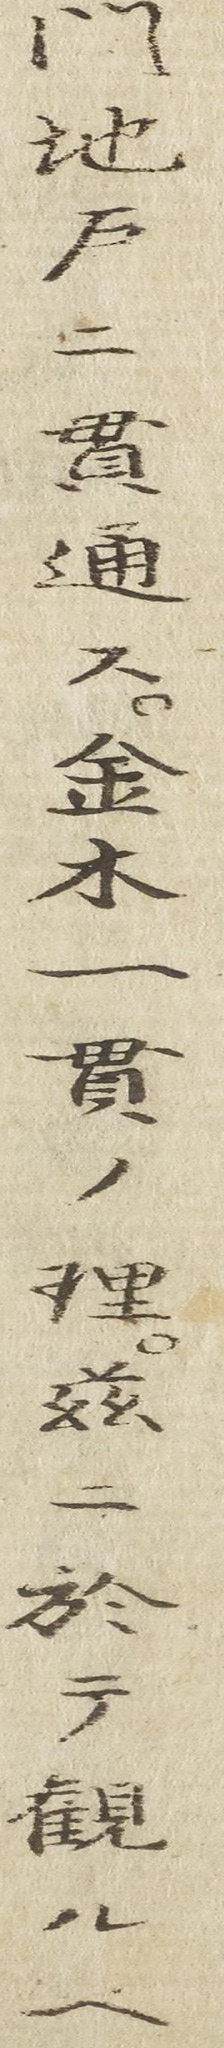門地戸ニ貫通ス。金木一貫ノ理。茲ニ於テ観ルヘ
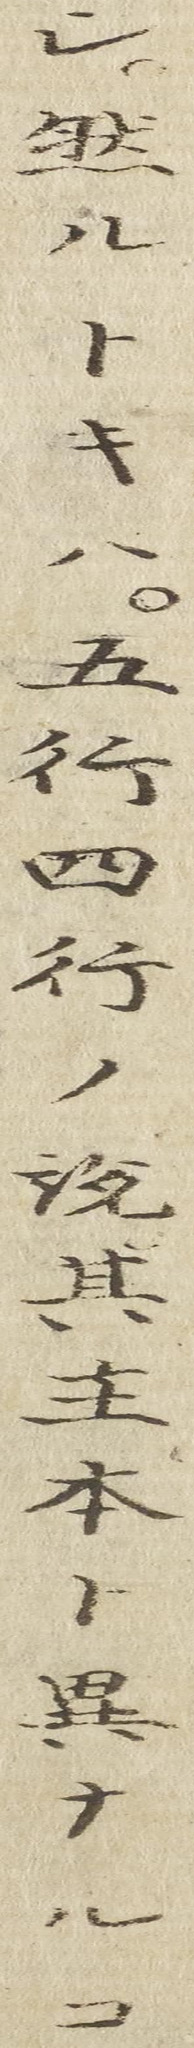シ。然ルトキハ。五行四行ノ説。其主本ト異ナルコ

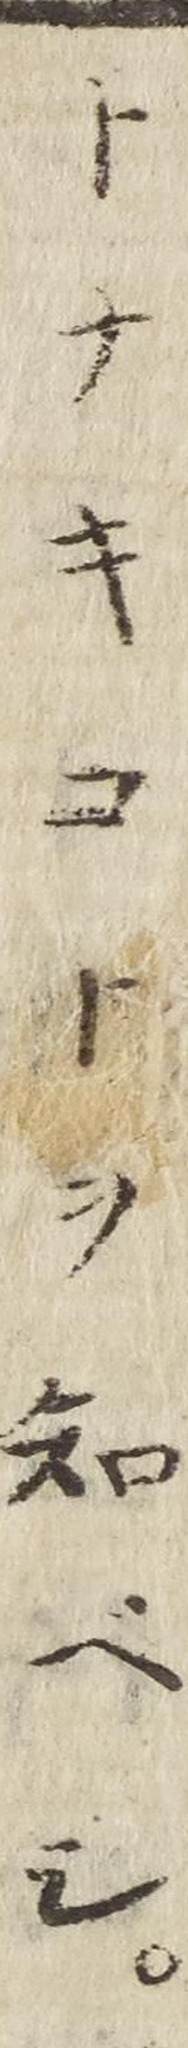トナキコトヲ知ベシ。
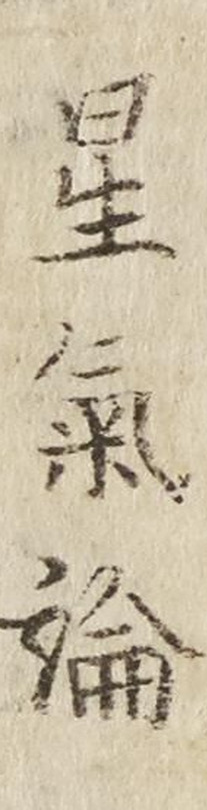星気論
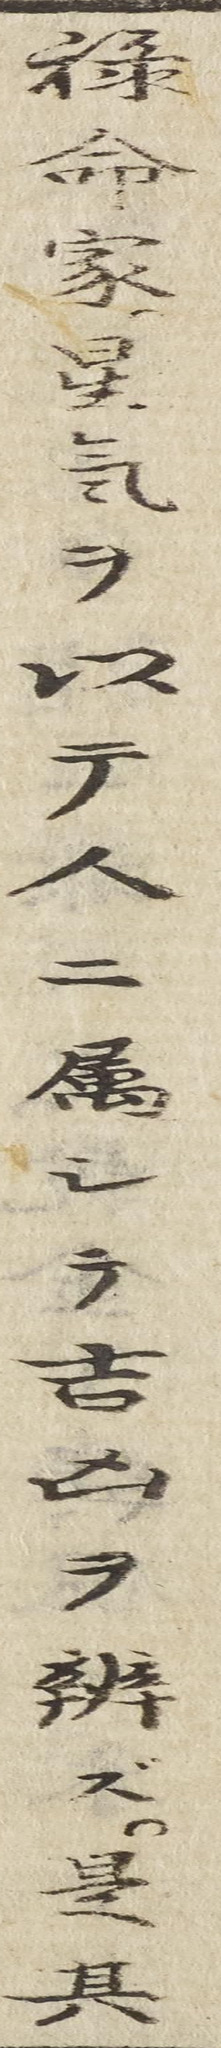禄命家。星気ヲ以テ人ニ属シテ吉凶ヲ弁ズ。是其
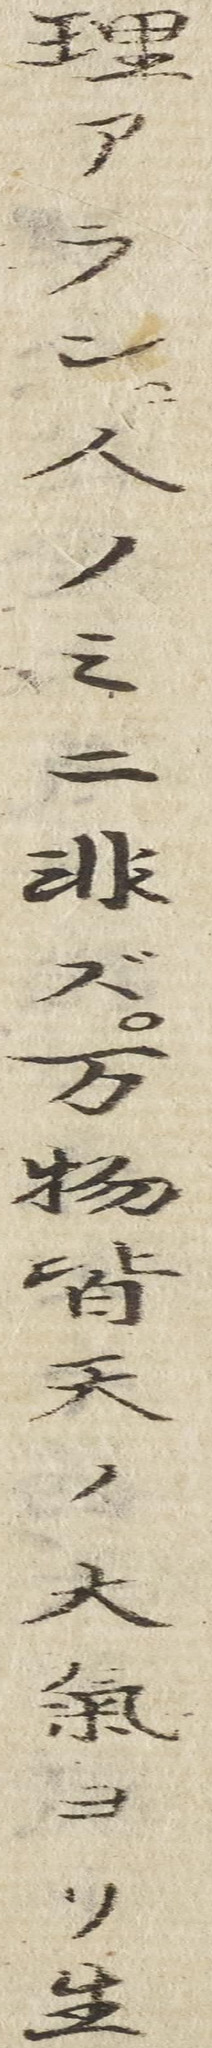理アラン。人ノミニ非ズ。万物皆天ノ大気ヨリ生
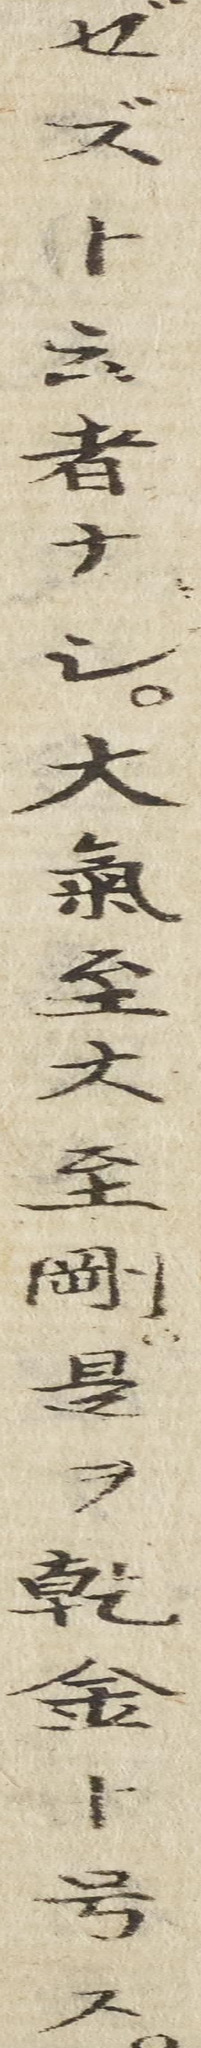ゼズト云者ナシ。大気至大至剛。是ヲ乾金ト号ス。
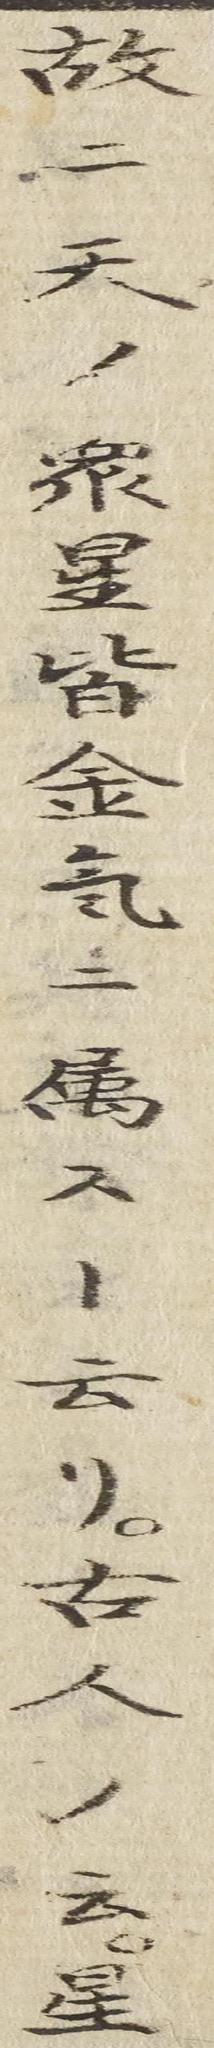故ニ天ノ衆星皆金気ニ属スト云リ。古人ノ云。星
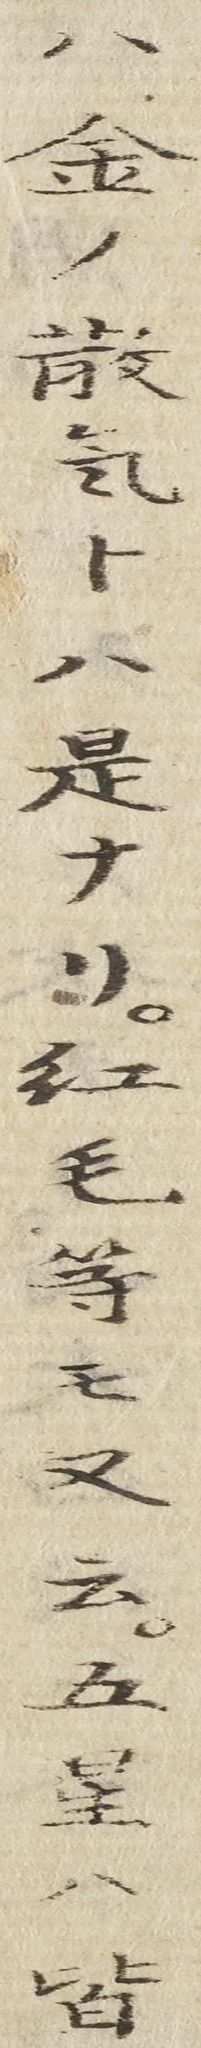ハ金ノ散気トハ是ナリ。紅毛等モ又云。五星ハ皆
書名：大略天学名目鈔　天經或問附録
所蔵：東京大学地震研究所図書室 Earthquake Research Institute Library, The University of Tokyo, JAPAN
